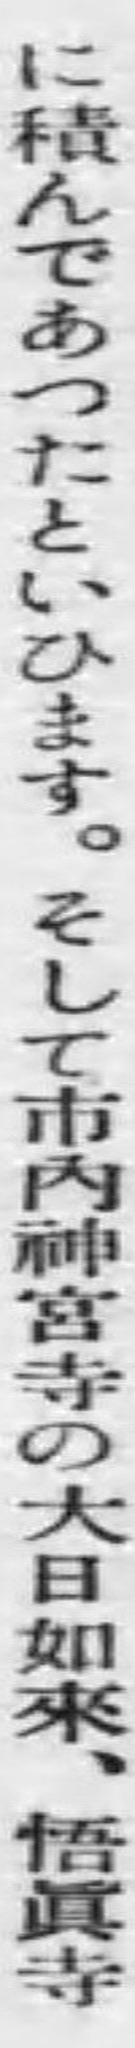に積んであつたといひます。そして市内神宮寺の大日如来、悟真寺
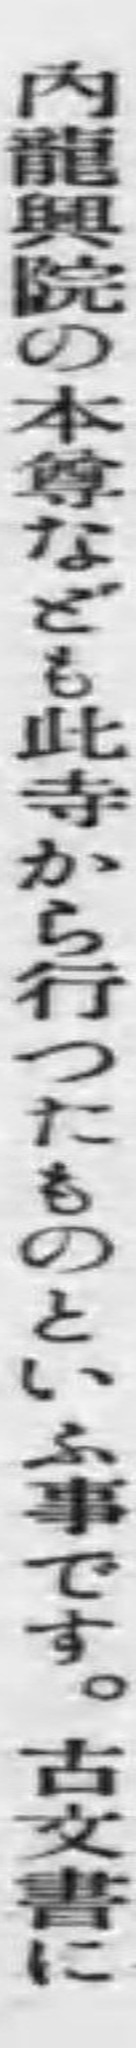内龍興院の本尊なども此寺から行つたものといふ事です。古文書に
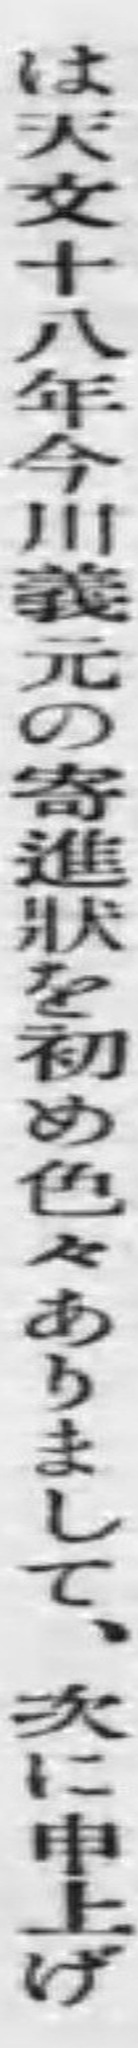は天文十八年今川義元の寄進状を初め色々ありまして、次に申上げ
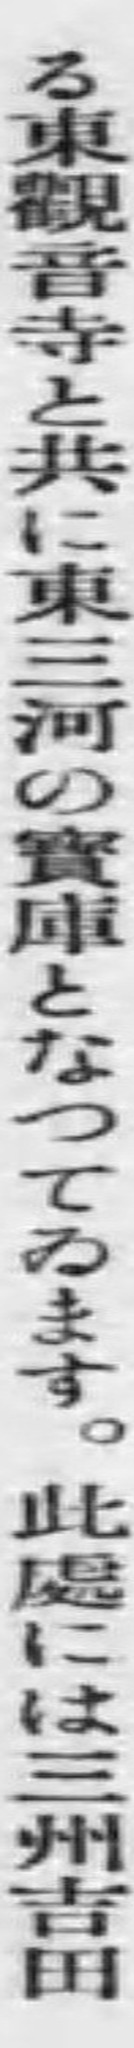る東観音寺と共に東三河の宝庫となつてゐます。此処には三州吉田
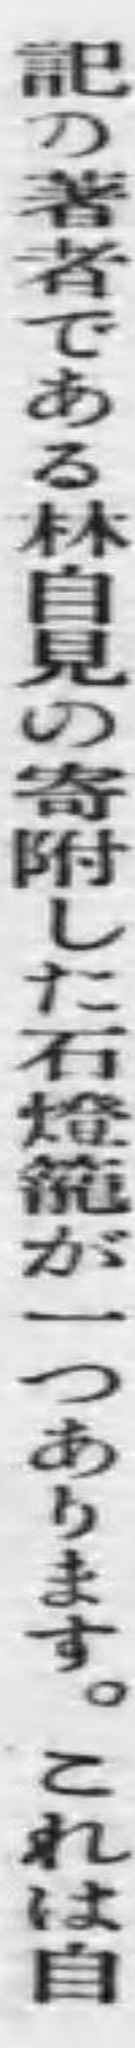記の著者である林自見の寄附した石灯籠が一つあります。これは自
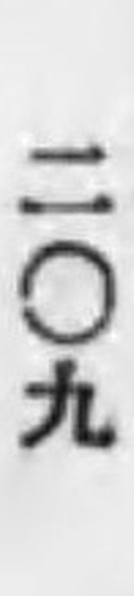二〇九

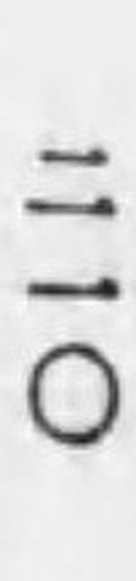二一〇
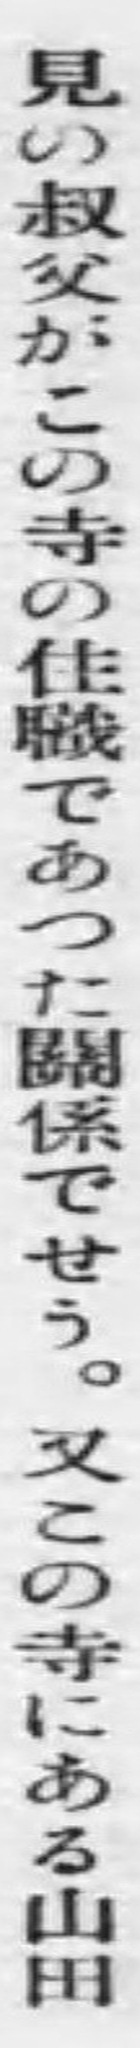見の叔父がこの寺の住職であつた関係でせう。又この寺にある山田
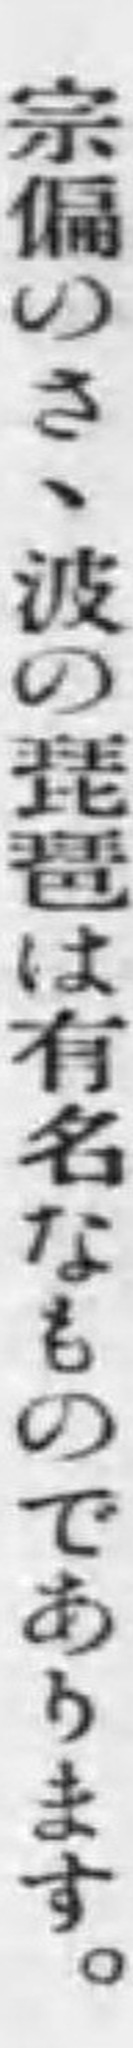宗偏のさゝ波の琵琶は有名なものであります。
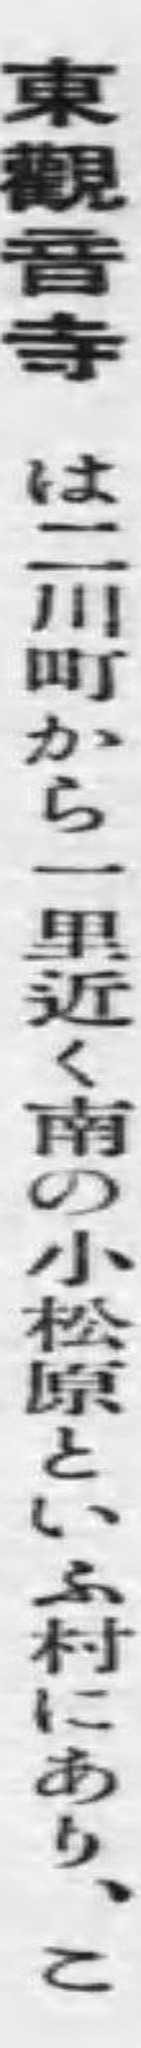東観音寺は二川町から一里近く南の小松原といふ村にあり、こ
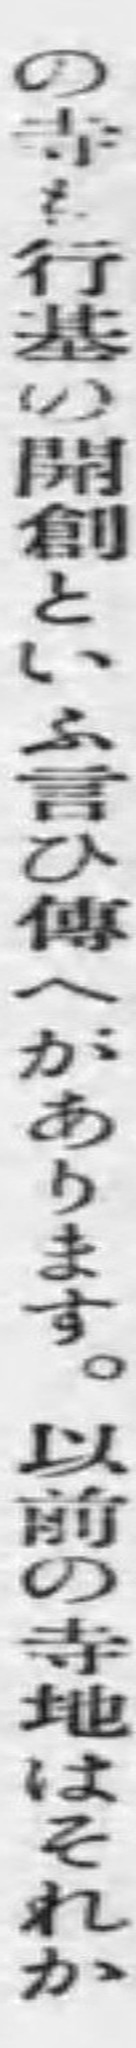の寺も行基の開創といふ言ひ伝へがあります。以前の寺地はそれか
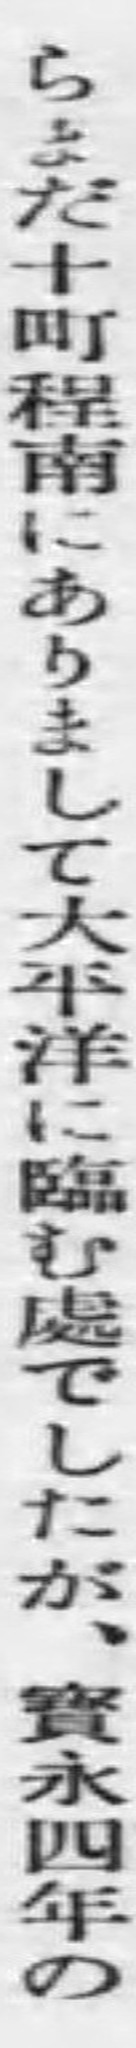らまだ十町程南にありまして大平洋に臨む処でしたが、宝永四年の
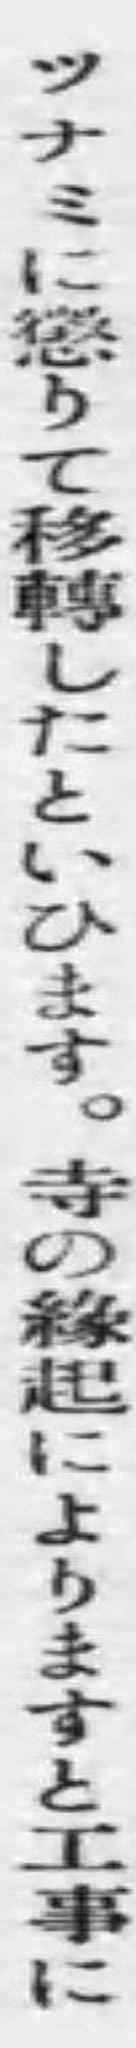ツナミに懲りて移転したといひます。寺の縁起によりますと工事に
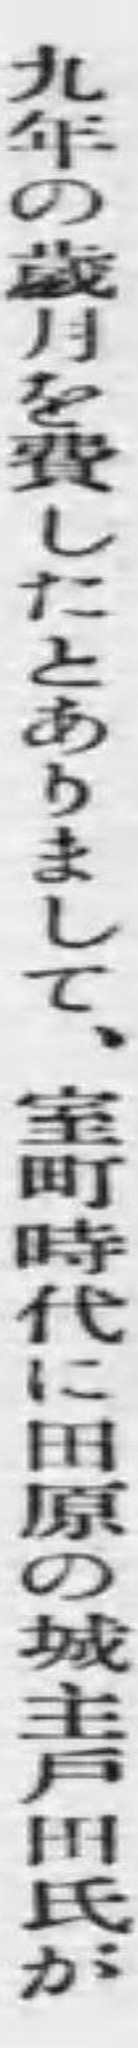九年の歳月を費したとありまして、室町時代に田原の城主戸田氏が
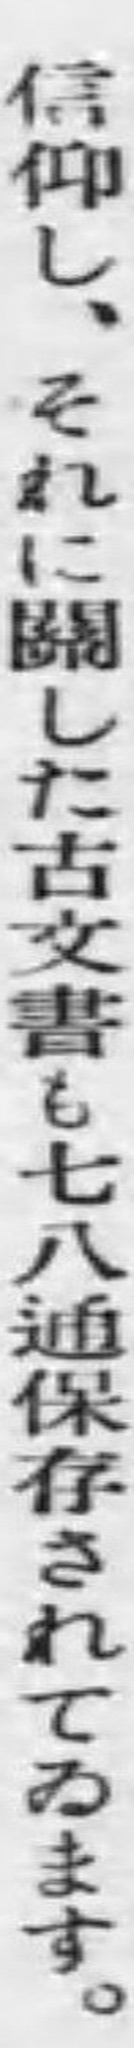信仰し、それに関した古文書も七八通保存されてゐます。
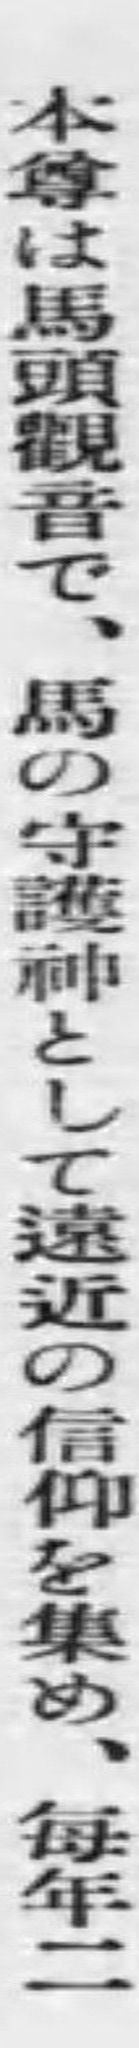本尊は馬頭観音で、馬の守護神として遠近の信仰を集め、毎年二
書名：東三河道中記 : 豊橋市及其附近案内
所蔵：国立国会図書館 National Diet Library, JAPAN
